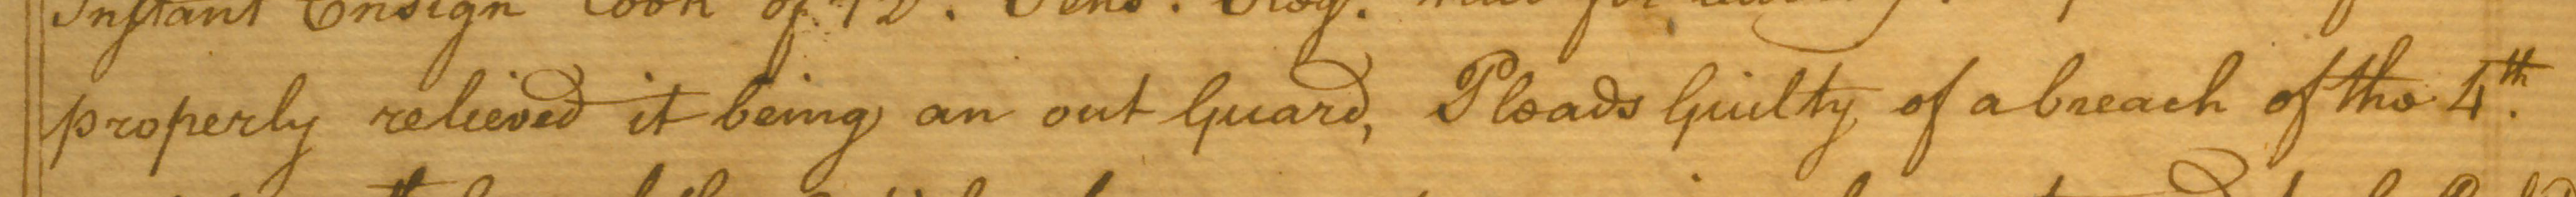properly relieved it being an out Guard, Pleads Guilty of a breach of the 4^th.
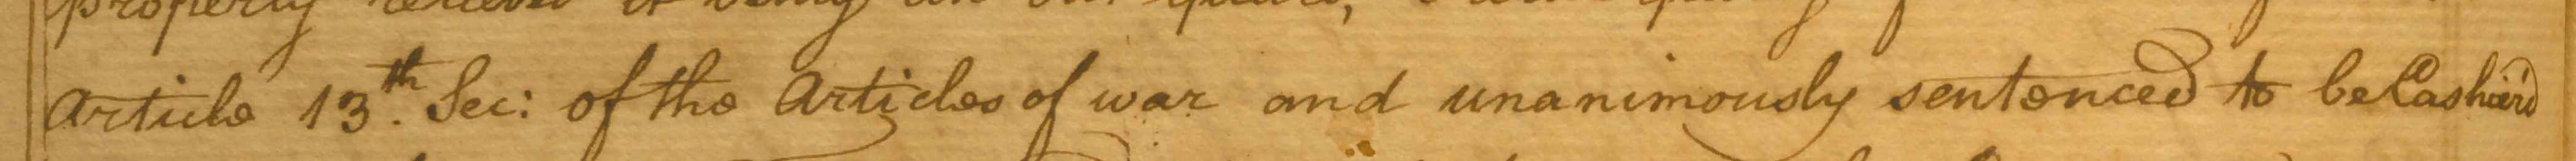Article of 13^th. Sec: of the Articles of war and unanimously sentenced to be Cashier'd
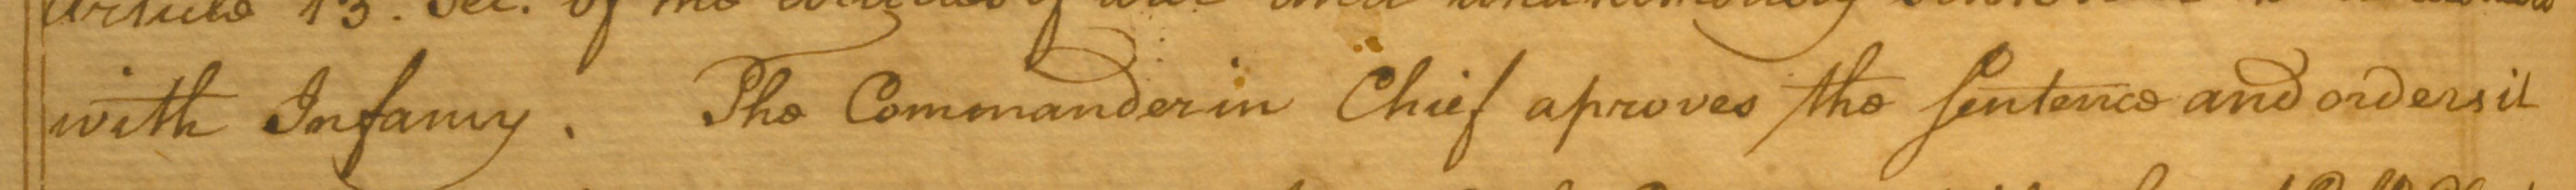with Infamy. The Commander in Chief approves the sentences and orders it
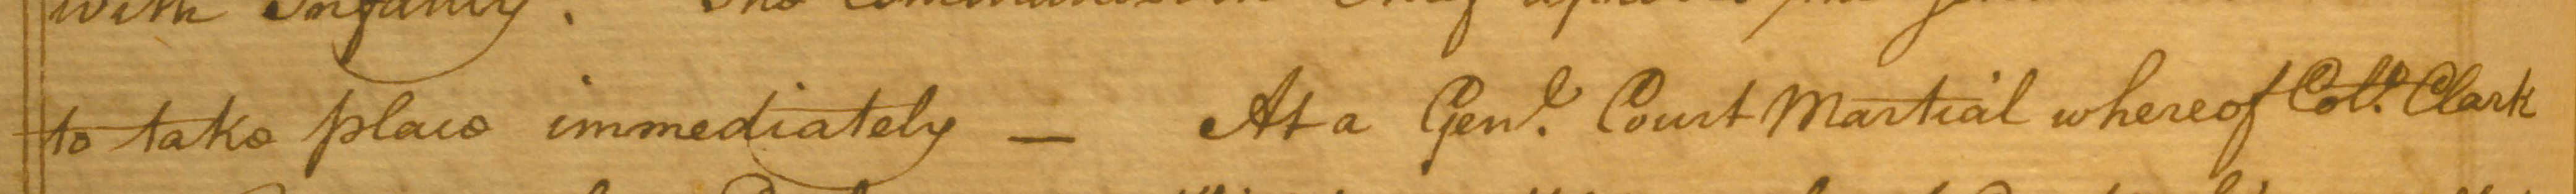to take place immediately- At a Gen^l. Court Martial whereof Col^o. Clark
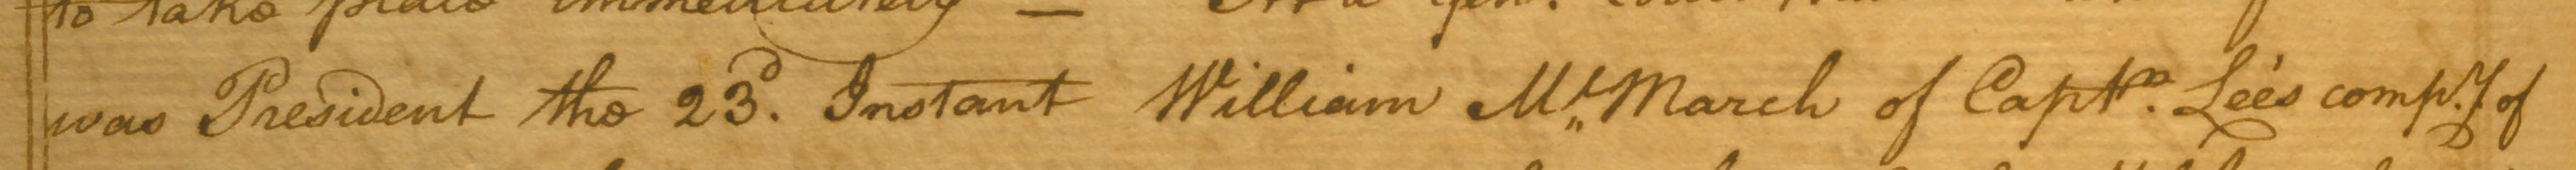was President the 23^d. Instant William M^cMarch of Capt^n. Lee's comp^y of
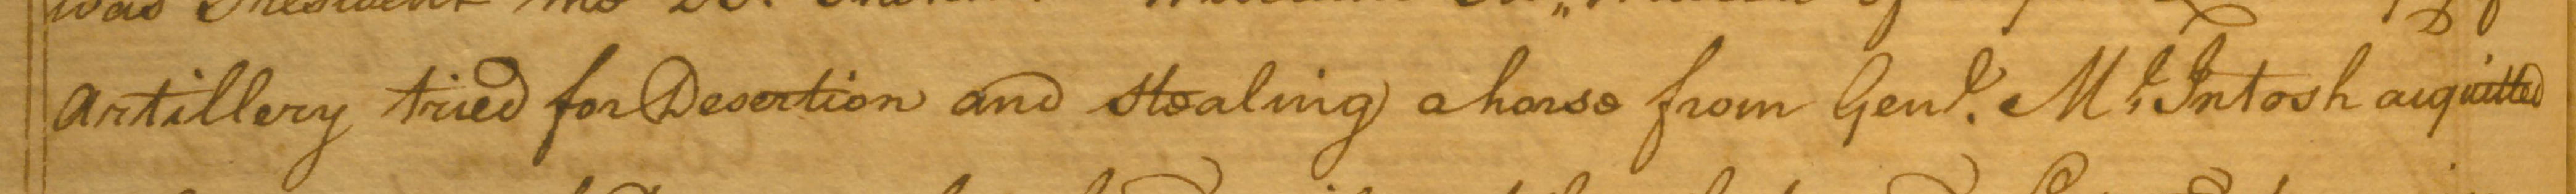Artillery tried for Desertion and stealing a horse from Gen^l. M^c.Intosh acquitted
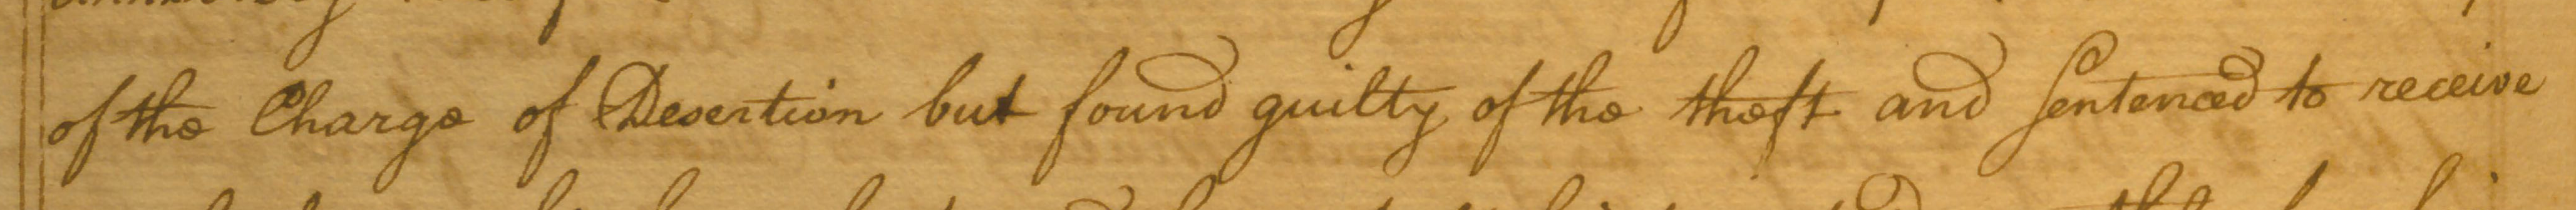of the Charge of Desertion but found guilty of the theft and sentenced to receive
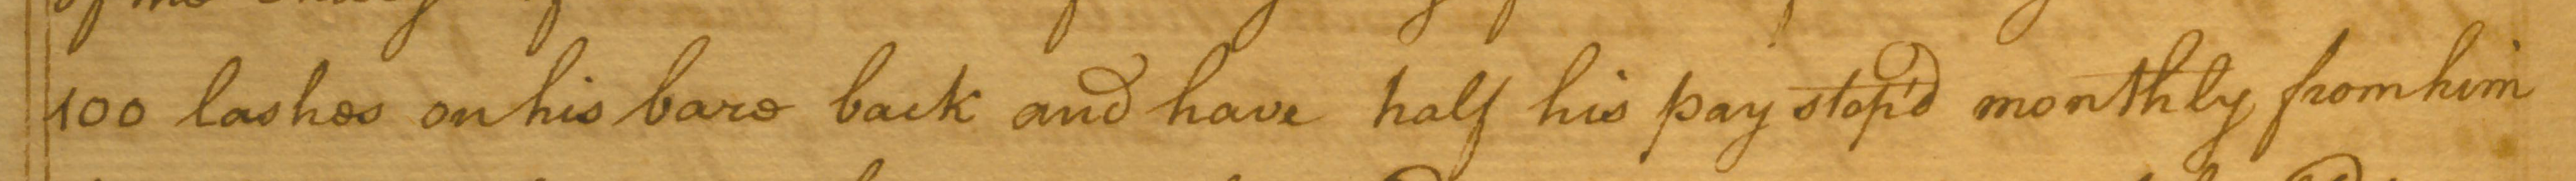100 lashes on his bare back and have half his pay stop'd monthly from him
